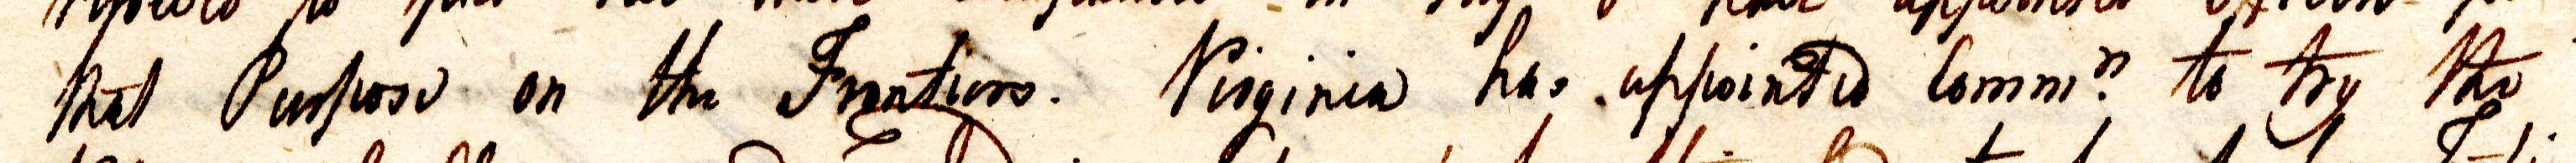that Purpose on the Frontiers. Virginia has appointed Comm^rs. to try the
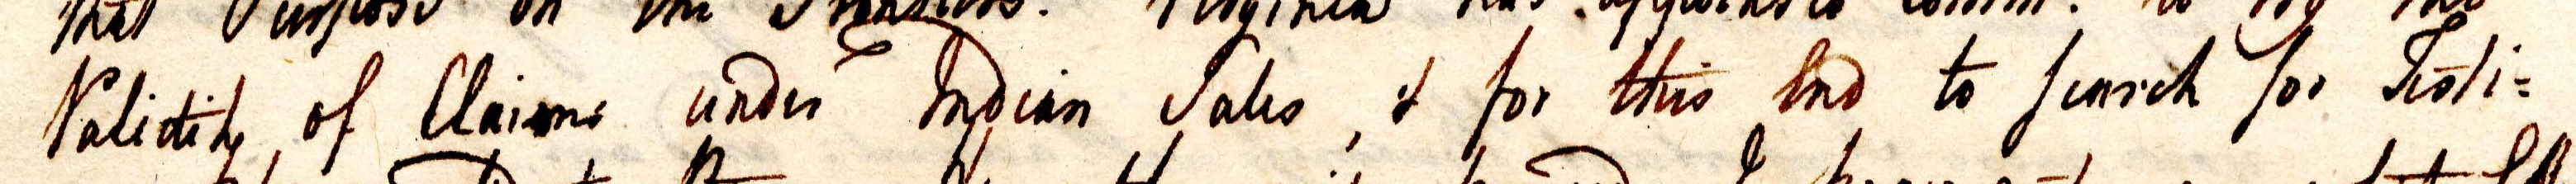Validity of Claims under Indian Sales, & for this End to search for Testi-
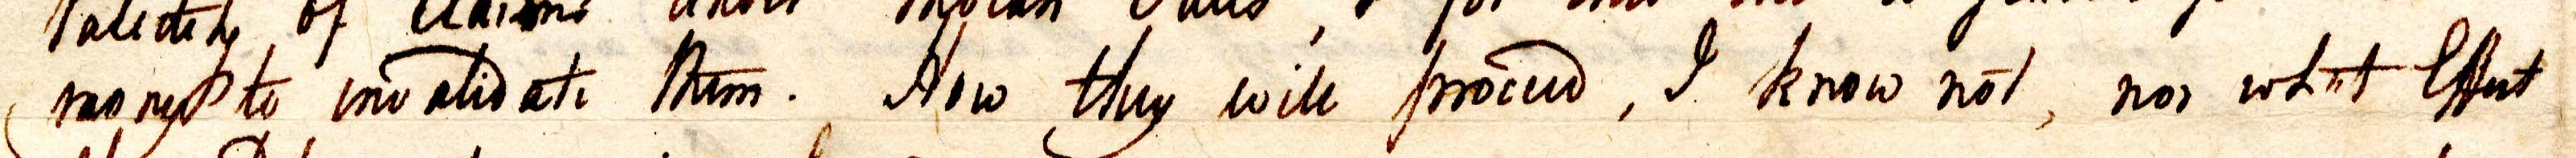mony to invalidate them. How they will proceed, I know not, nor what Effect
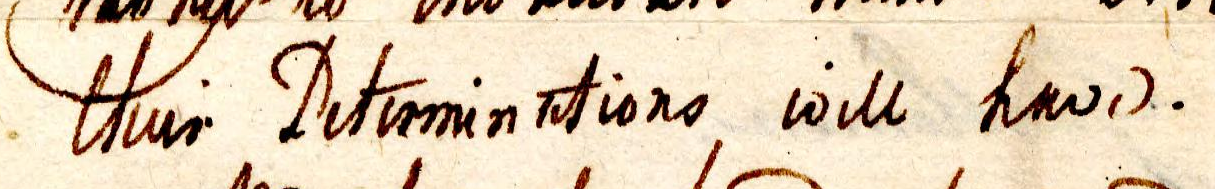their Determinations will have.
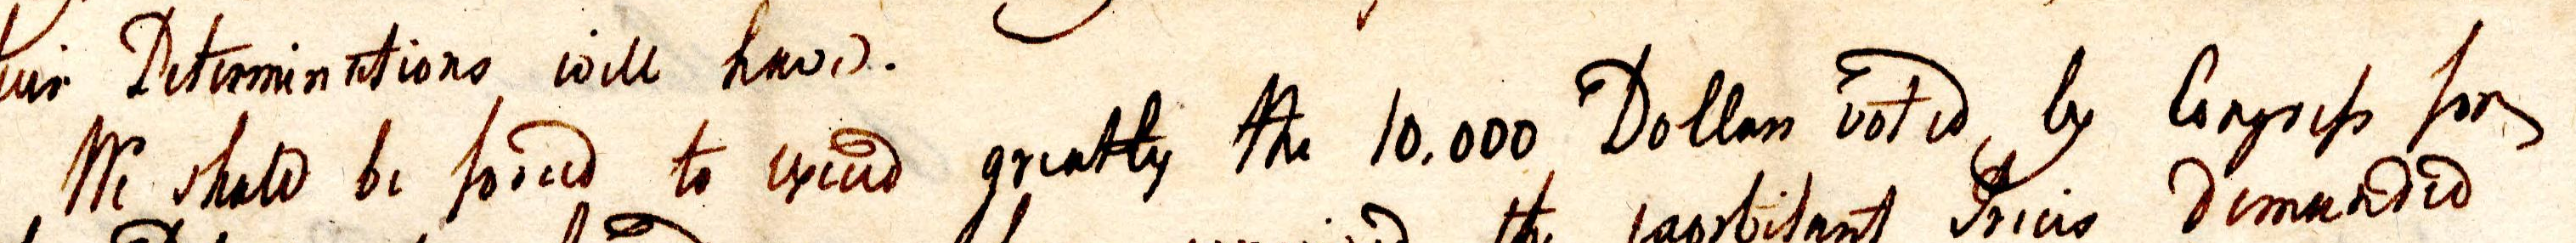We shall be forced to exceed greatly the 10,000 Dollars voted by Congress for
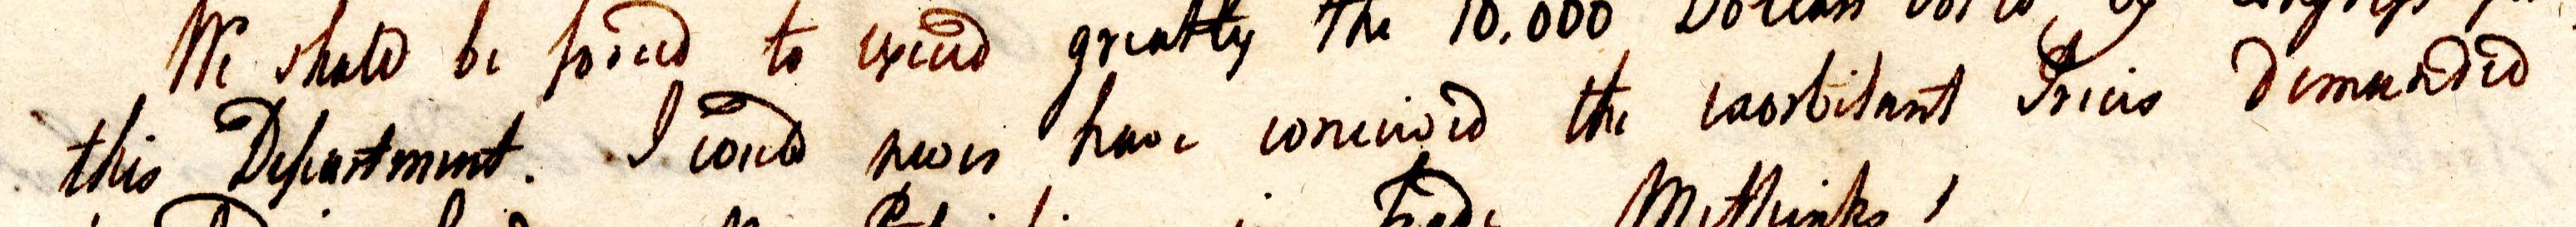this Department. I could never have conceived the exorbitant Prices demanded
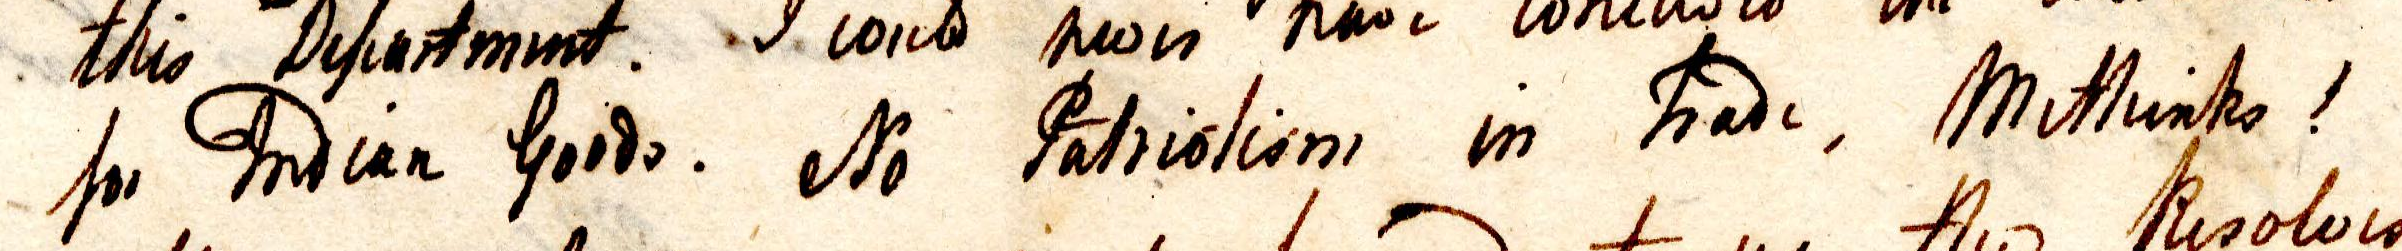for Indian Goods. No Patriotism in Trade, Methinks!
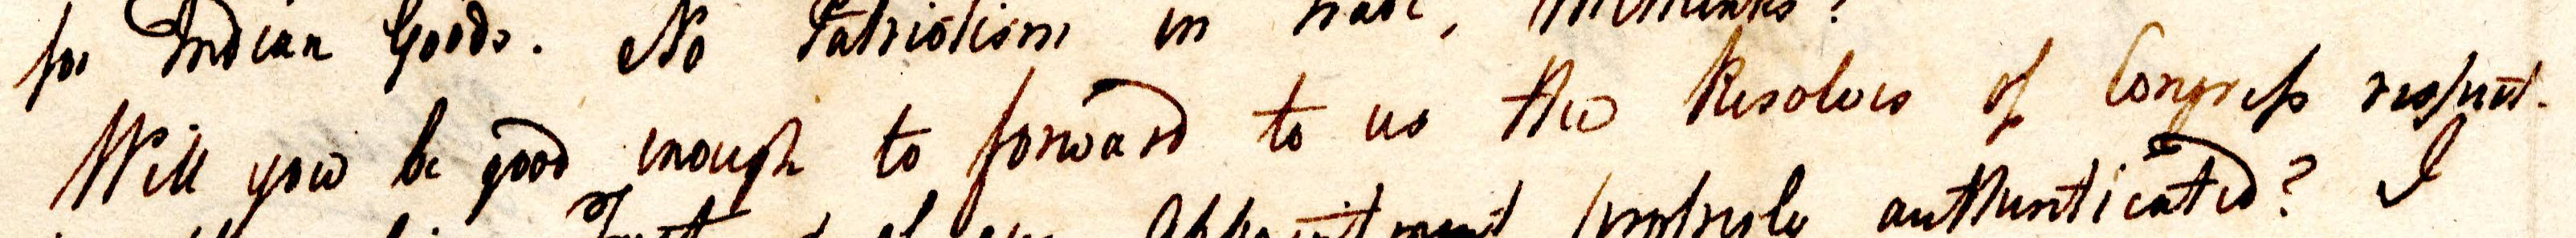Will you be good enough to forward to us the Resolves of Congress respect-
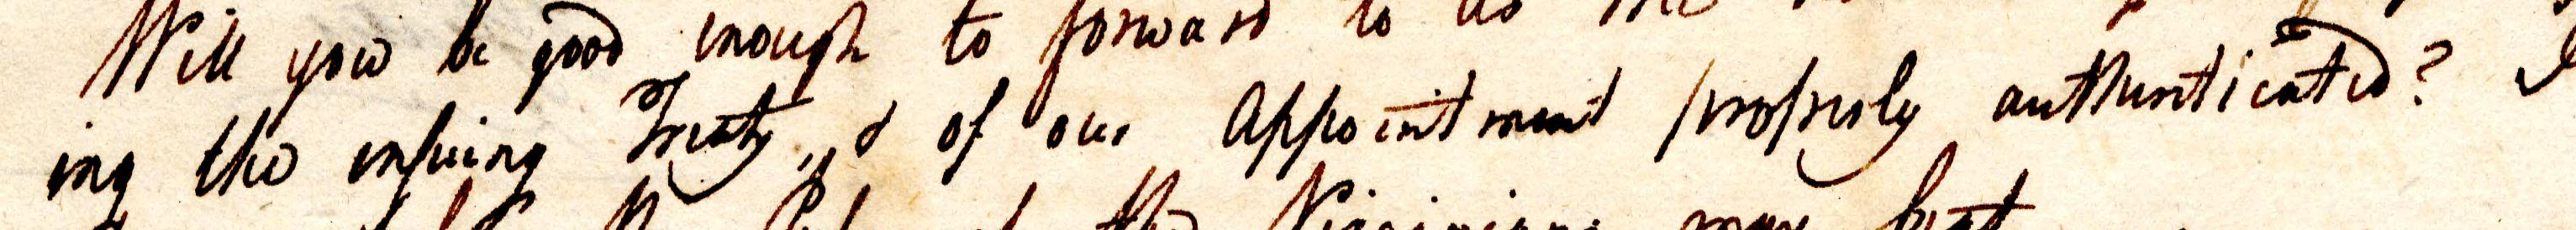ing the ensuing Treaty, & of our appointment properly authenticated? I
